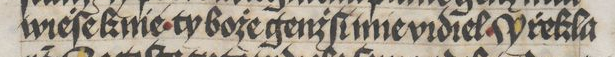wieẛe kníe.ty boże genż ſi mie vidiel.Yṙekla
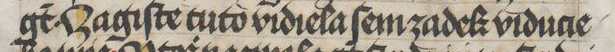ḡt.Zagiſte tuto vidiela ſem zadek viducie
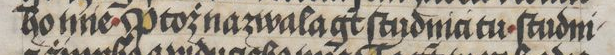ho mie.Ꝓtoż na zwala ḡt ſtudnici tu.ſtudni¬
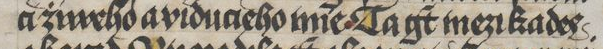ci żiweho a viducieho mie.Ta ḡt mezi kades.
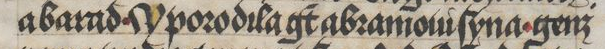a barad.Y porodila ḡt abramoui ſyna.genż
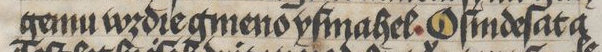gemu wzdie gmeno yſmahel.Oſmdeſat a
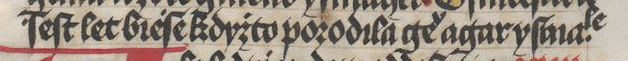ẛeſt let bíeẛe kdyżto pozodila gev agar yſmale.
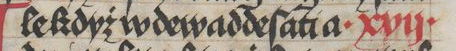le kdyż w dewaddeſati a.xvij.
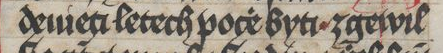deuietí letech pooe byti.zgewil
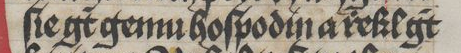ſie ḡt gemu hoſpodin a ṙekl ḡt
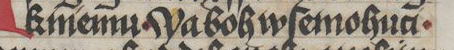kniemu.Ya boh wſemohuci.
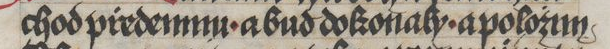chod pṙedemnu.a bud dokonaly.a polożím
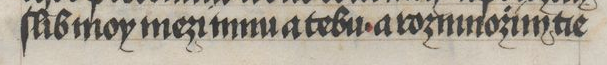ſlib moy mezi mnu a tebu.a rozmnożím tie
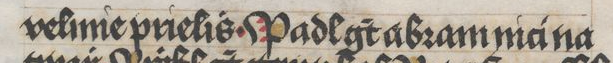velmie prieliš.Padl ḡt abram nici na
